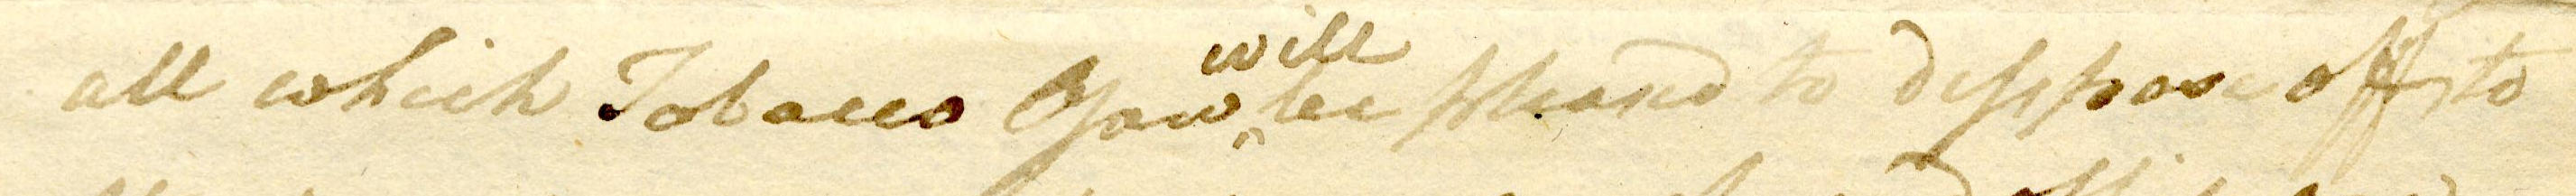all which Tobacco you ^ be pleased to dispose off to
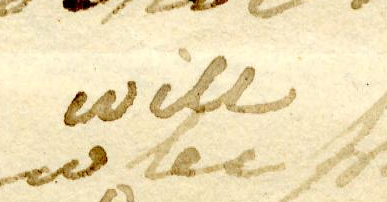will
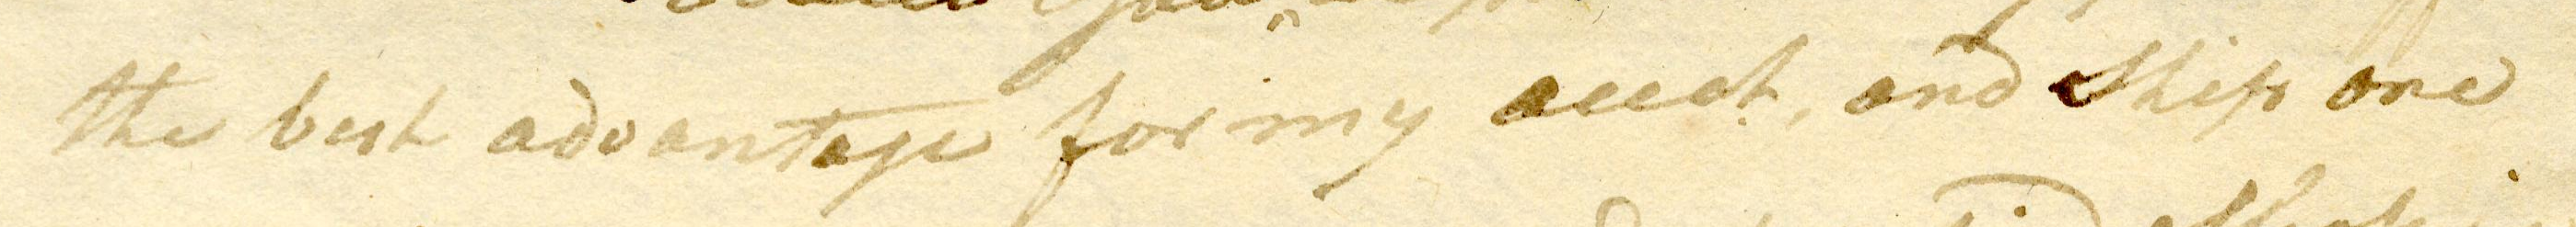the best advantge for my acc^t., and ship one
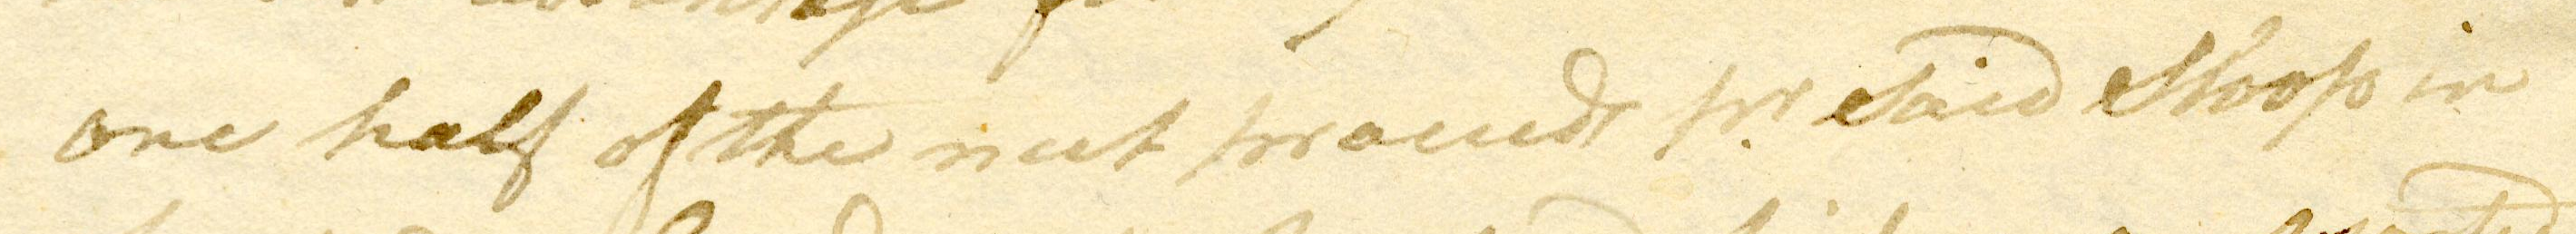one half of the neet proceeds f^r said sloop in
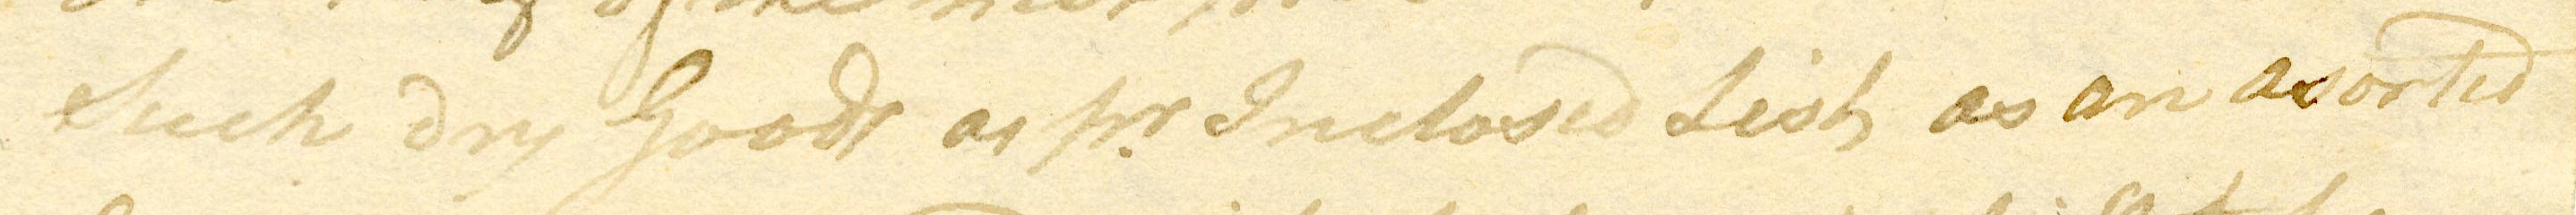such dry Goods as for Inclosed List, as an asorted
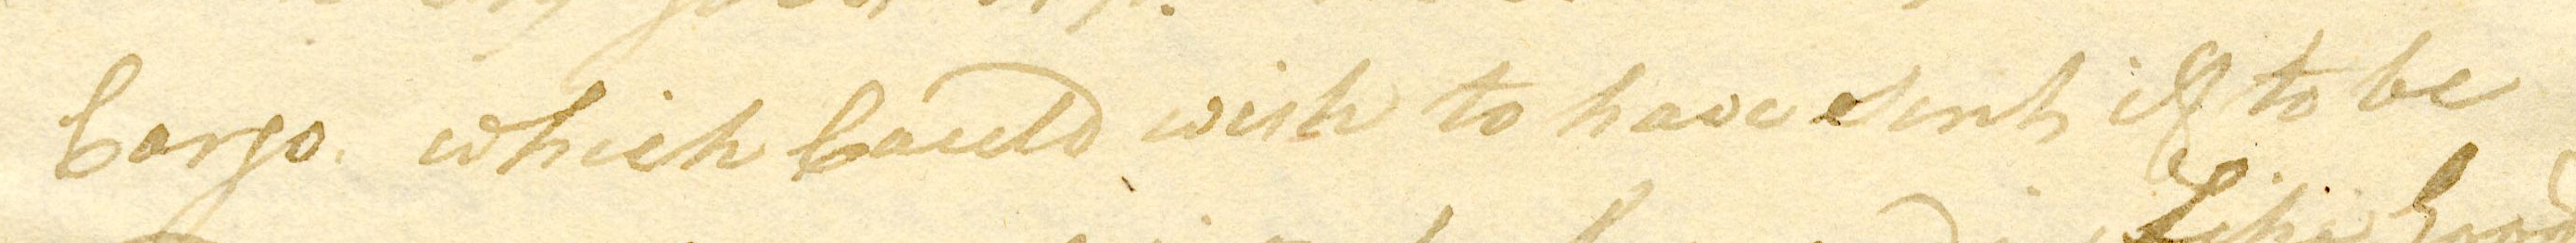Cargo. which could wish to have sent, if to be
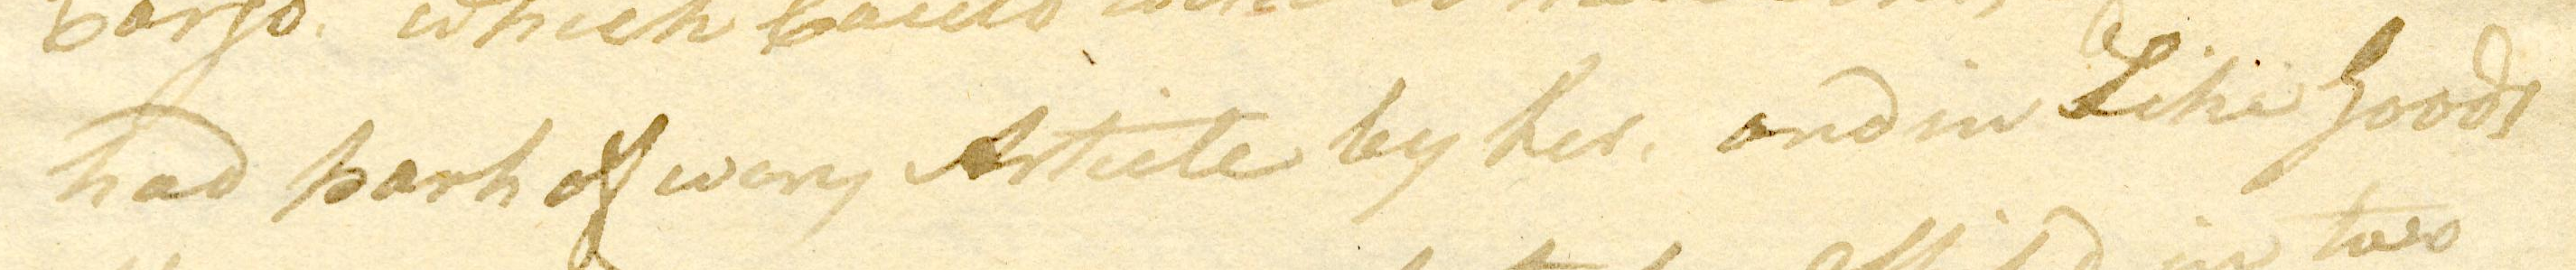had part of every Article by her, and in Like Goods
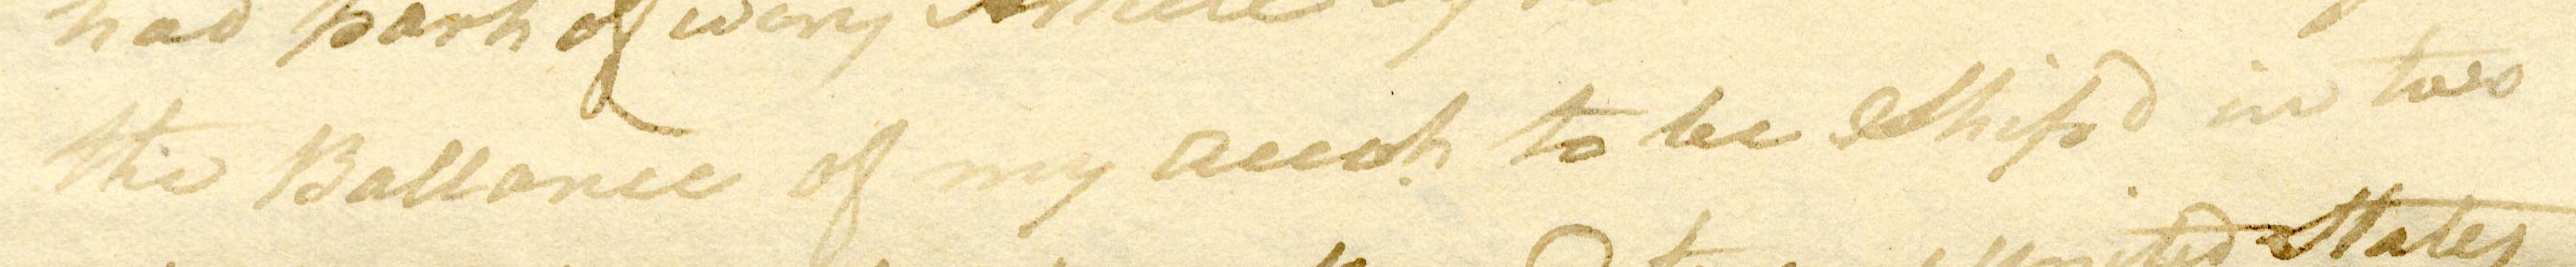the Ballance of my acco^t to be ship'd in two
